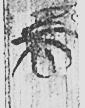而
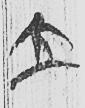立
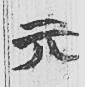亓
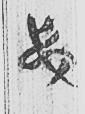弟
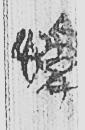悼
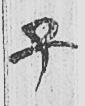子
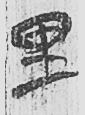里
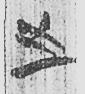之
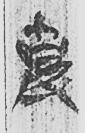尅
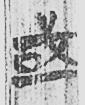或
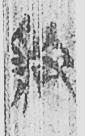殺
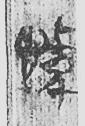悼
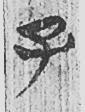子
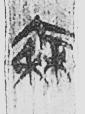秦
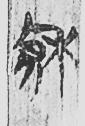穆
